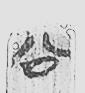公
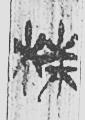株
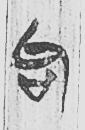句
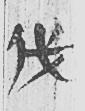伐
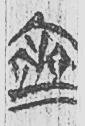齊
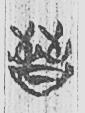晉
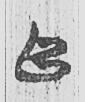𠂤
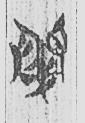{門戈}
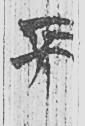長
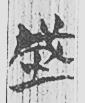城
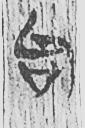句
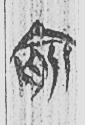俞
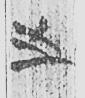之
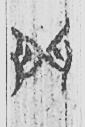門
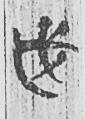戉
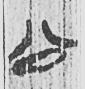公
